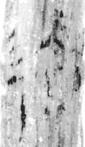○（夕）
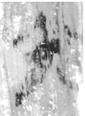內（入）
